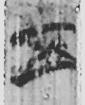五
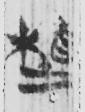{相止}
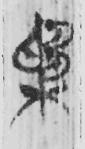柔
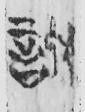{言比}（僻）
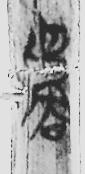矞
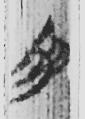易
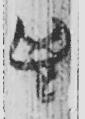凶
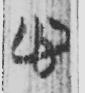心
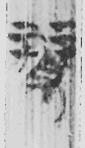{幵見}
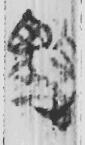{垔攴心}
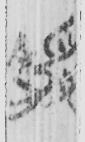嘉
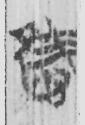惟
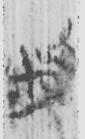料
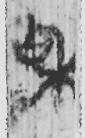和
